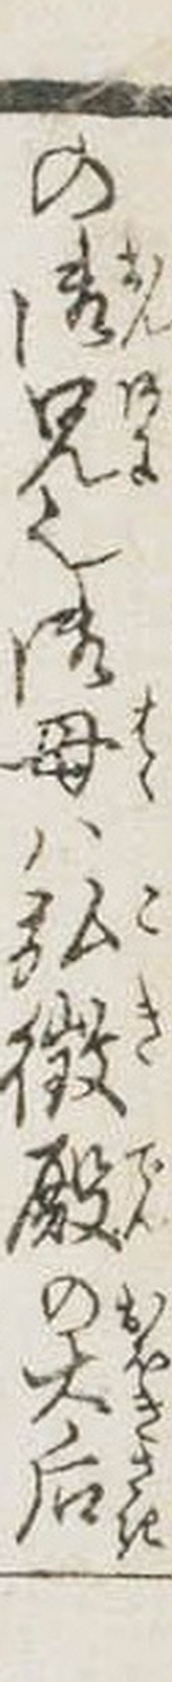の御兄也御母は弘徽殿の大后
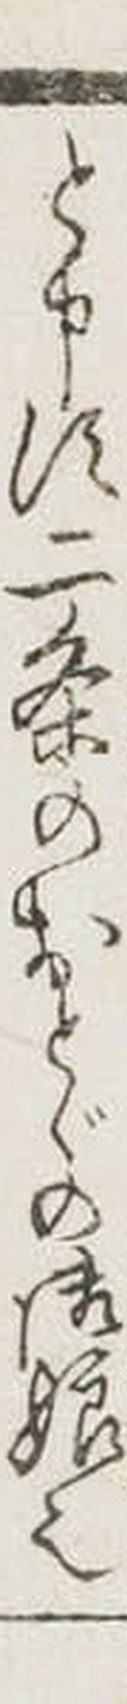と申す二条のおとゞの御娘也
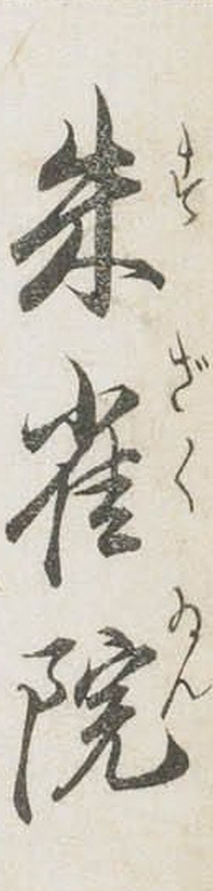朱雀院
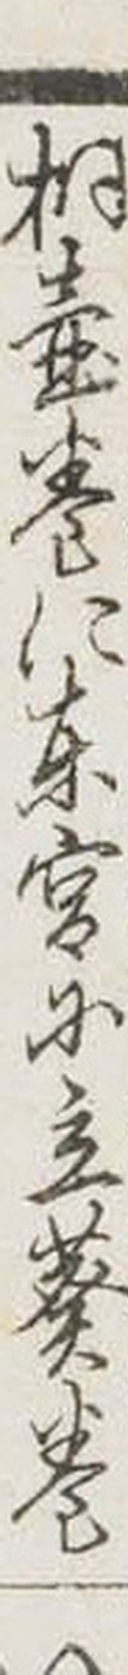桐壺巻に東宮に立葵巻
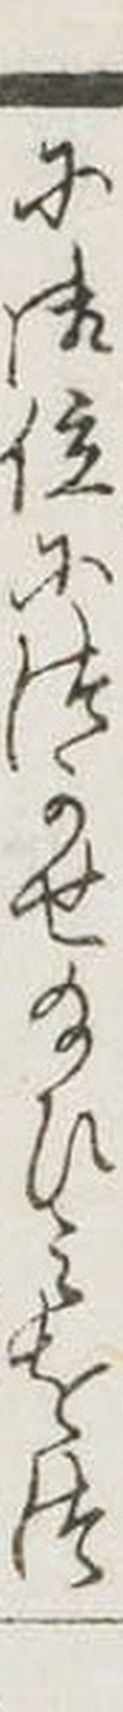に御位につかせ給ひみをつ
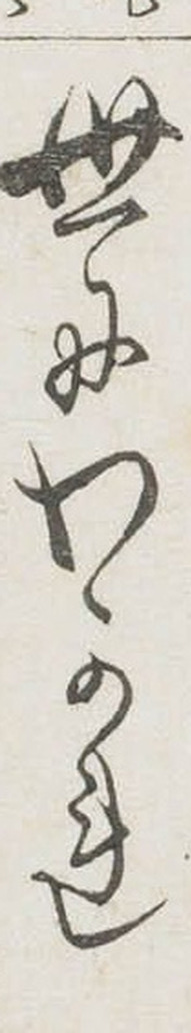世にわかれ
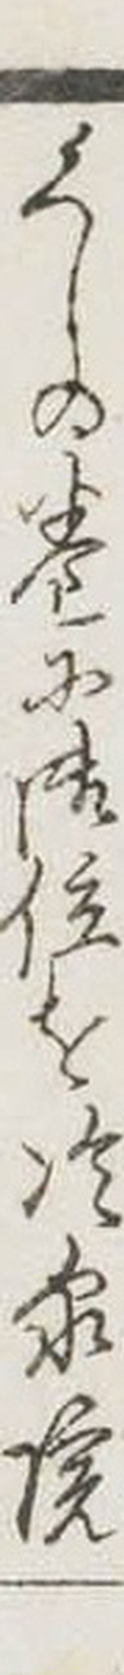くしの巻に御位を冷泉院
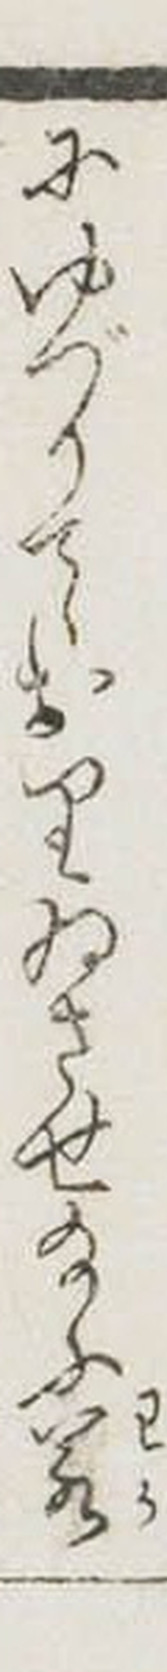にゆづりておりゐさせ給ふ若
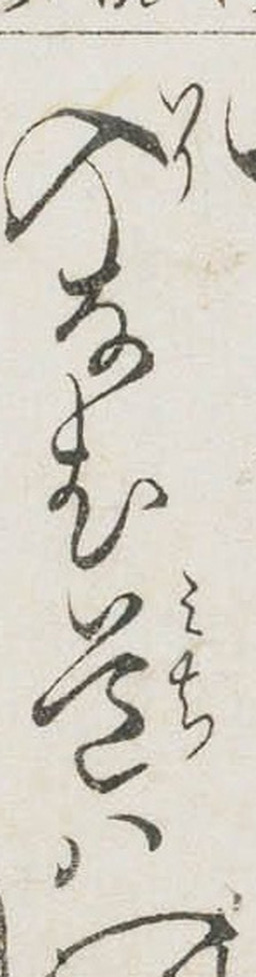入なむ道は
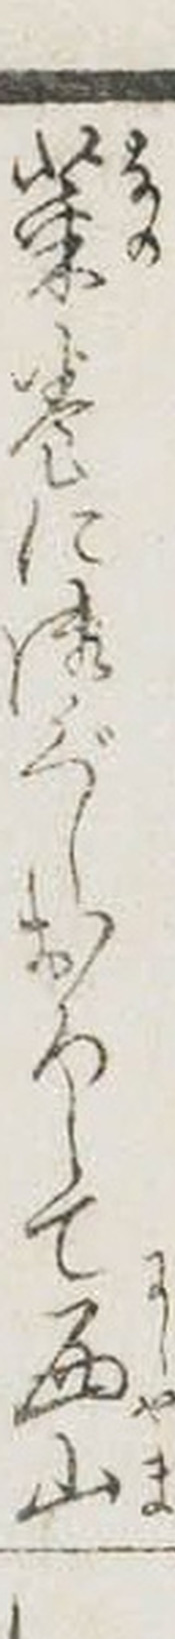菜巻に御ぐしおろして西山
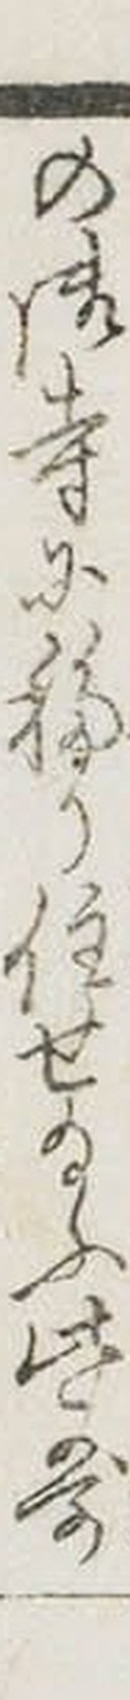の御寺に移り住せ給ふ此哥
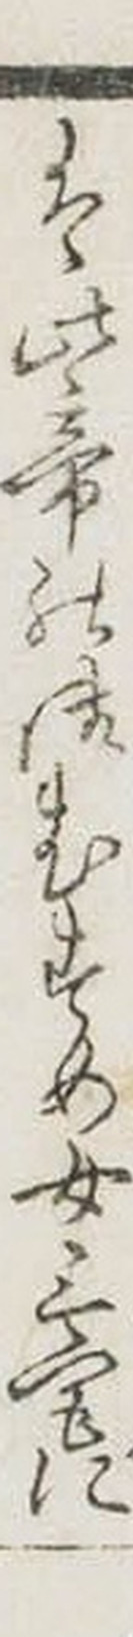は此帝の御むすめ女三宮に
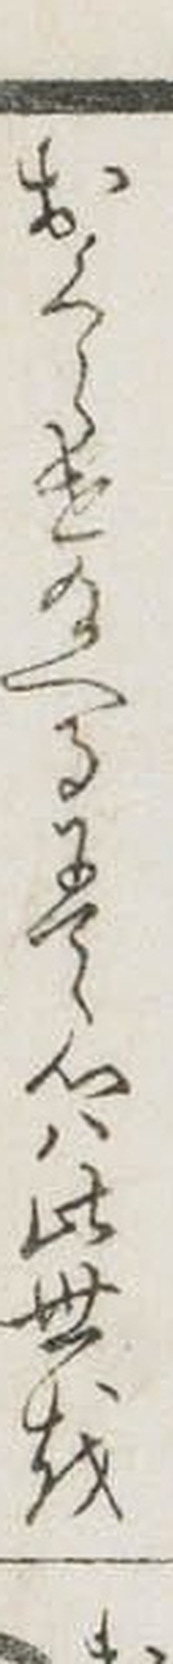おくらせ給へるにて心は此世を
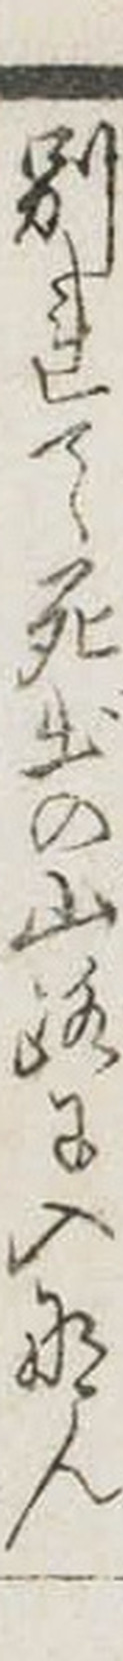別れて死出の山路に入なん
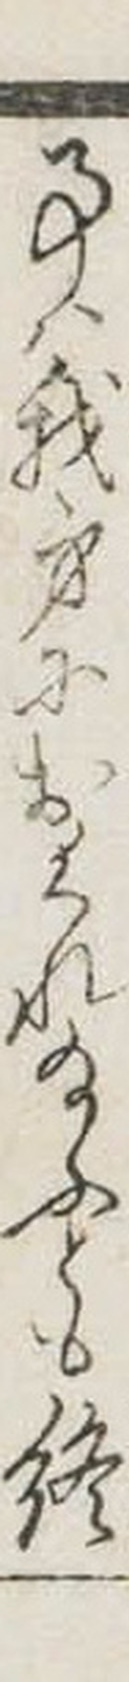事は我身におくれ給ふとも終
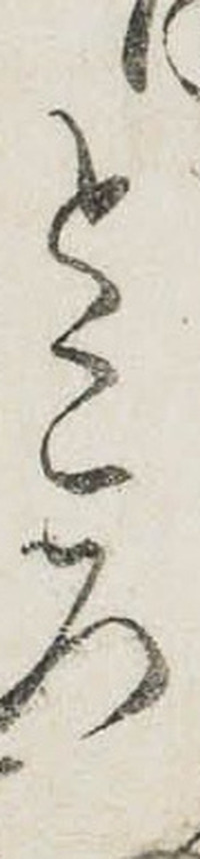ところ
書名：源氏百人一首
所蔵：東京学芸大学教育コンテンツアーカイブ
